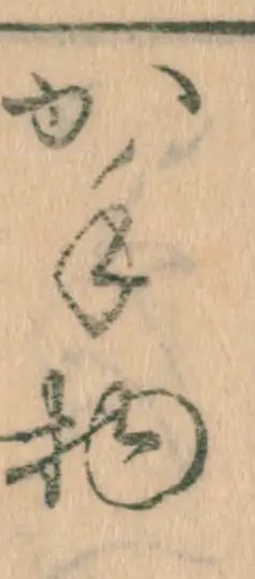かて物
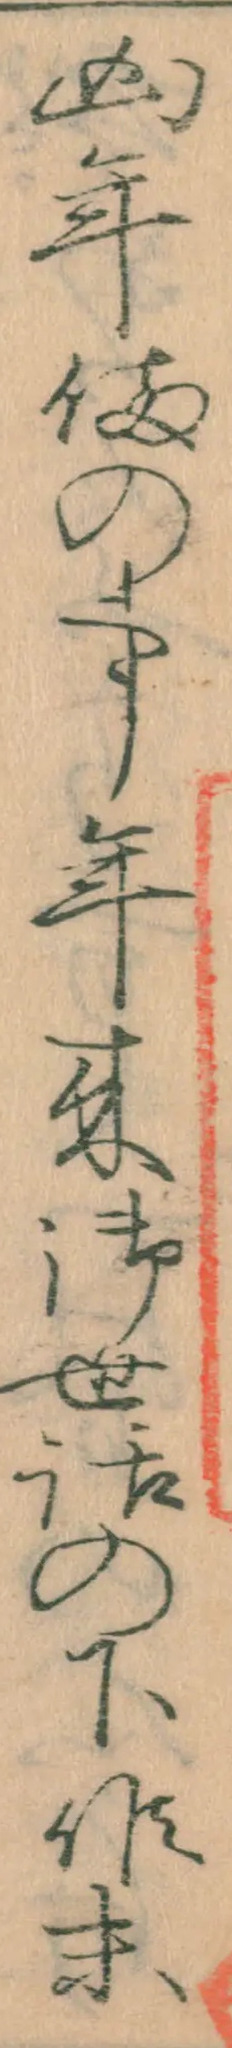凶年備の事年来御世話の下候末
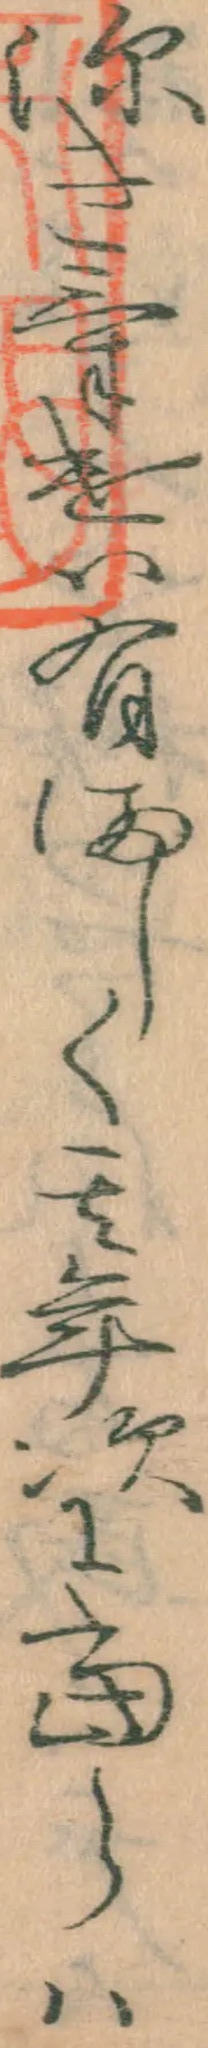深き気遣は有ましく其年次に当らは
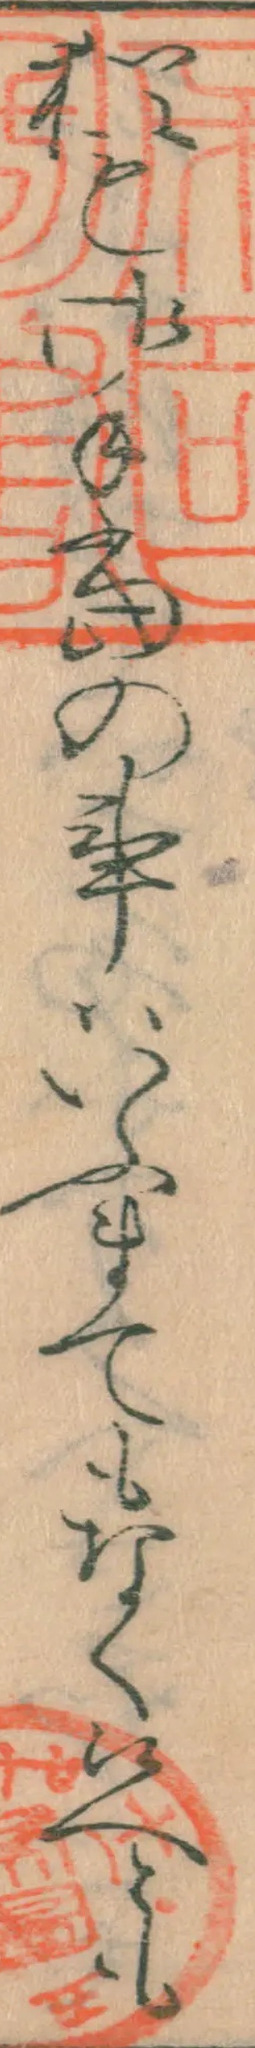猶も御手当の事はいふまてもなく候へとも
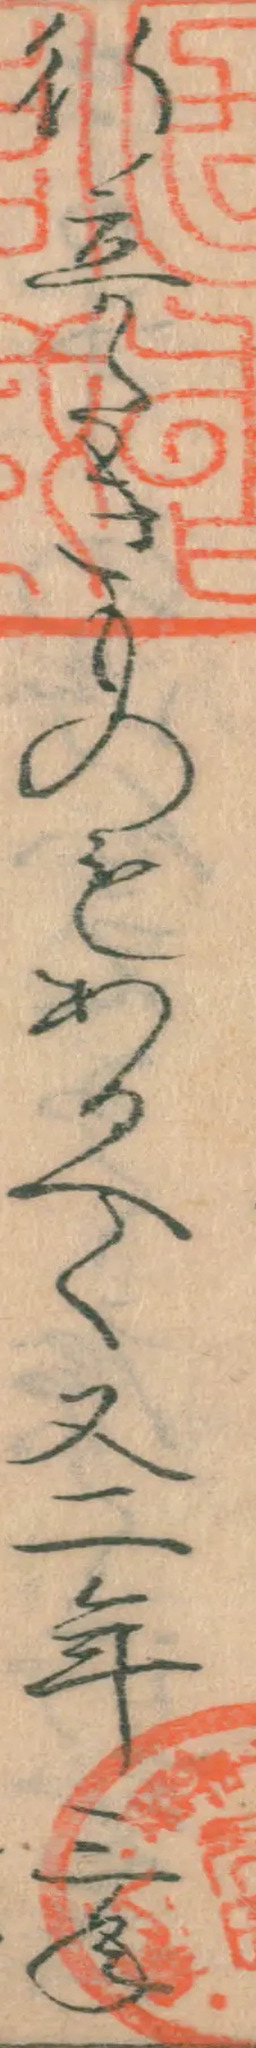行立かたきものもあるへく又二年三年
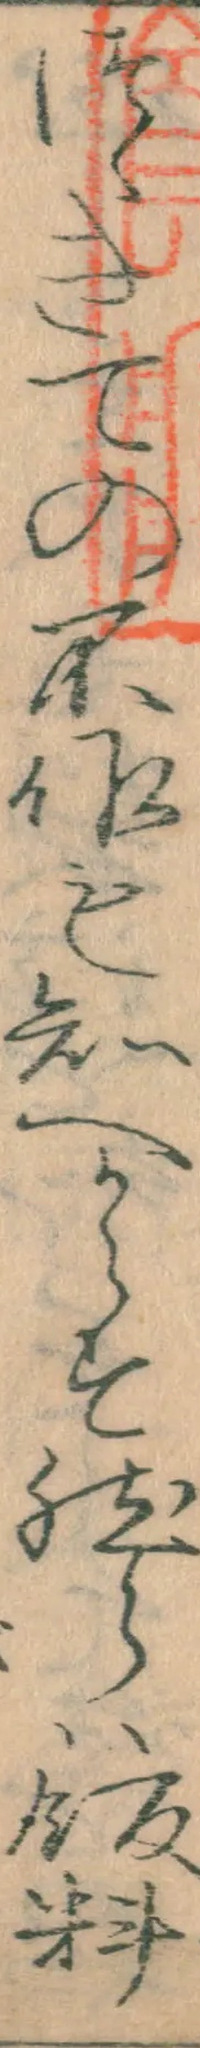つゝきての不作も知へからす然らは飯料
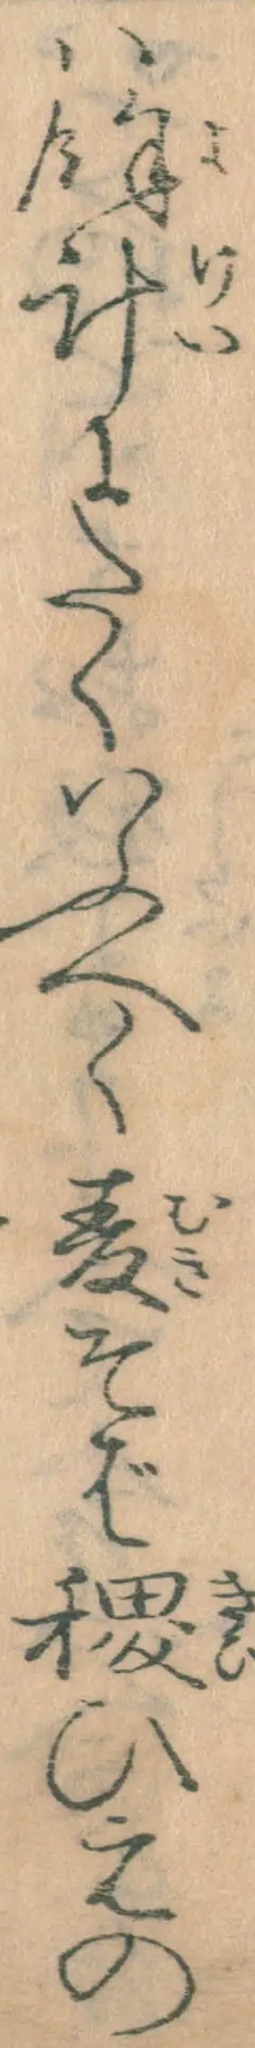は余計にたくはふへく麦そば稷ひえの
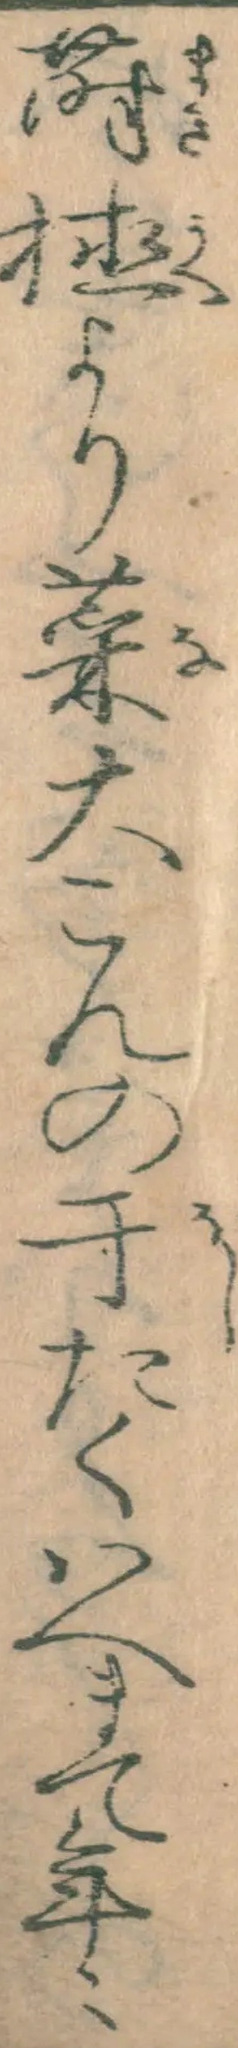蒔植より菜大こんの干たくはへまて年々

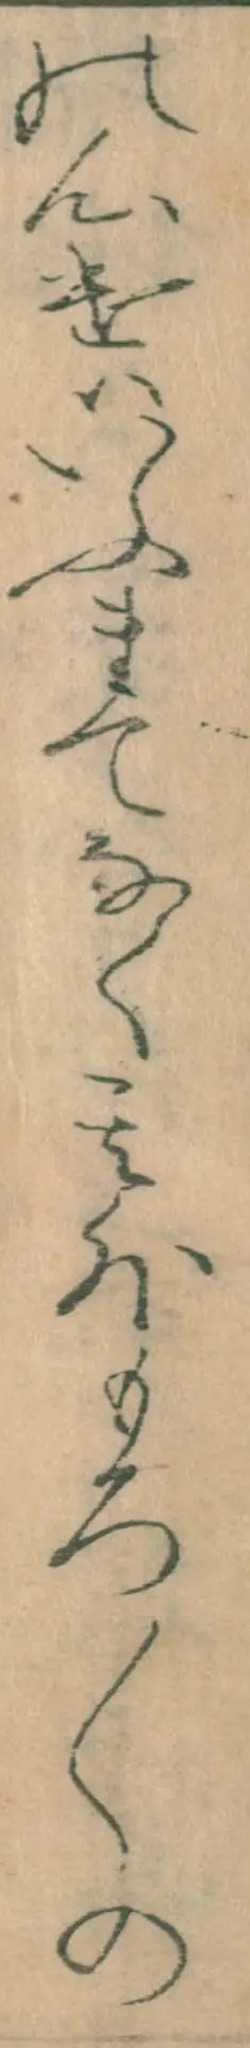の心遣はいふまてなく其外もろ〳〵の
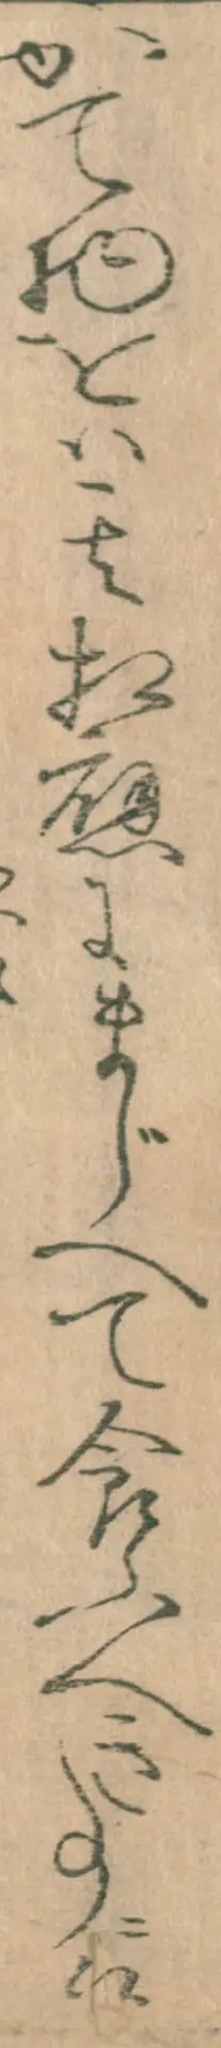かて物をは其相応にまじへて食ふへき事に候
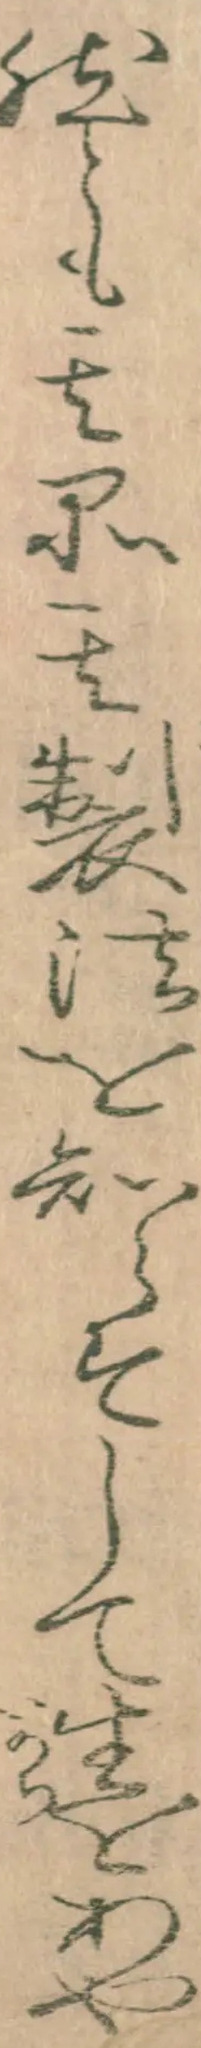然とも其品其製法を知らすして生をあや
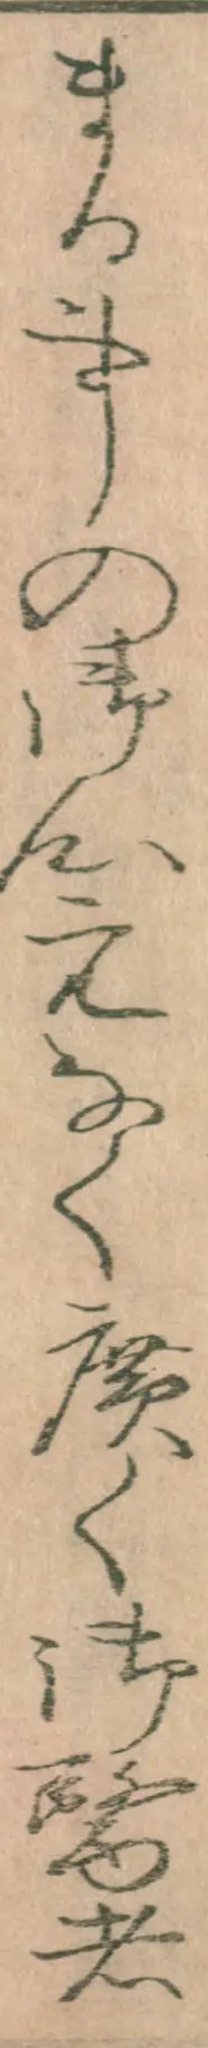まる事の御心元なく広く御医者
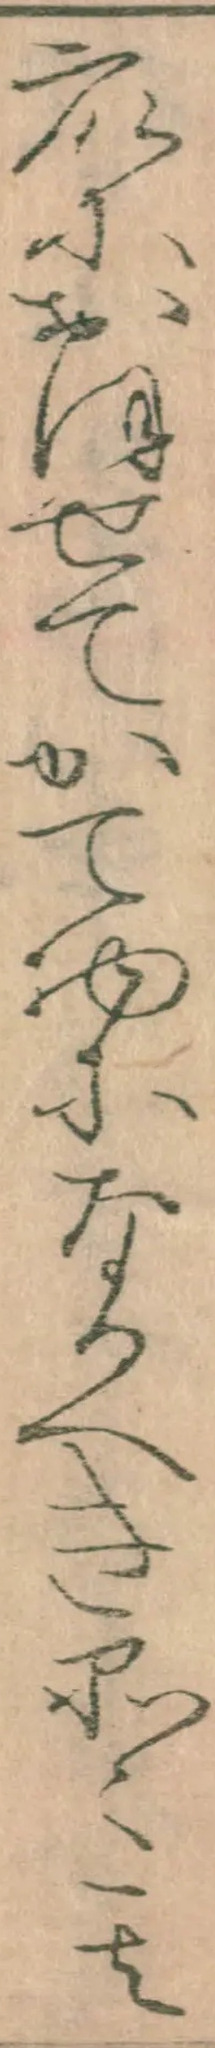衆におほせてかて物になるへき品々其
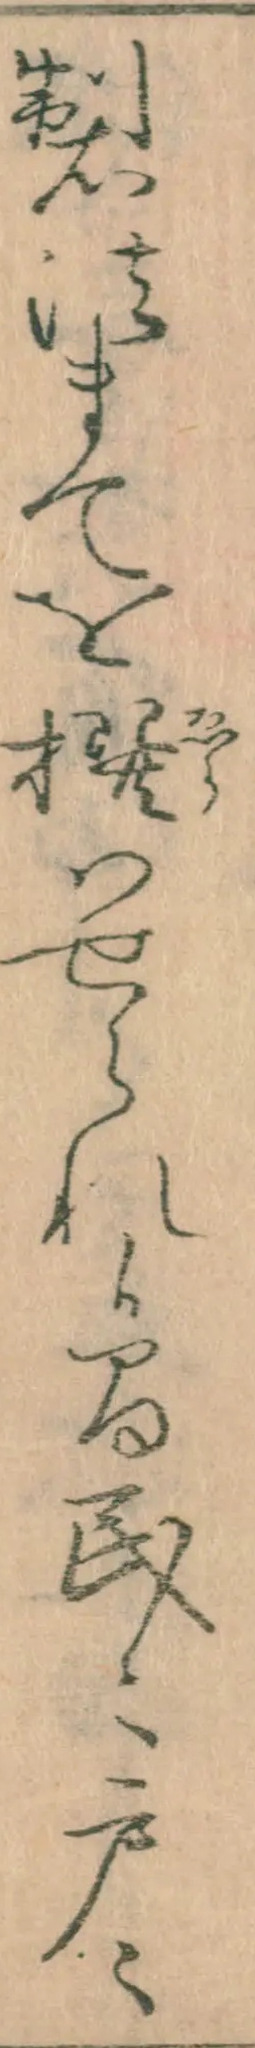製法まてを撰はせられ候間民々戸々
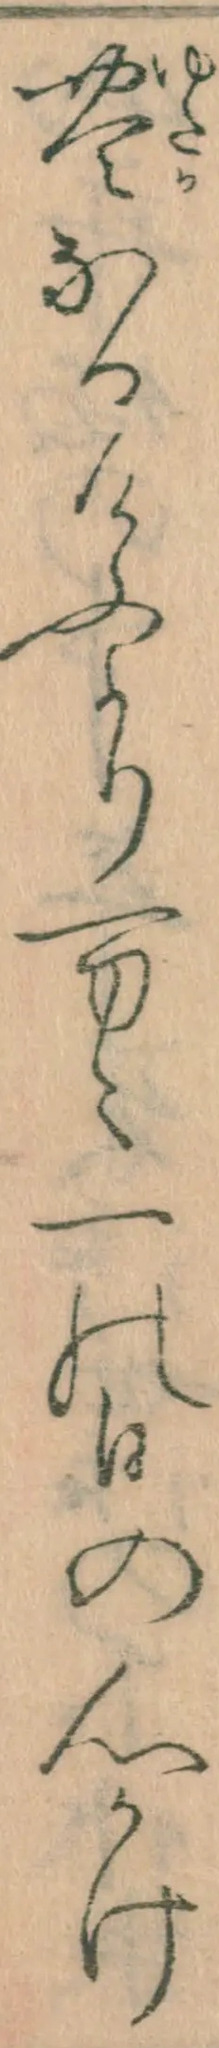豊なるけふより万々一の為の心かけ
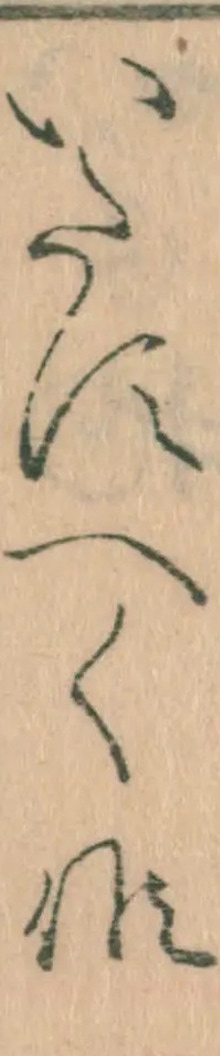いたすへく候
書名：かてもの
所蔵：国立国会図書館 National Diet Library, JAPAN
